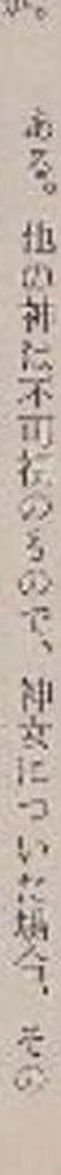ある。他の神は不可視のもので、神女についた場合、その
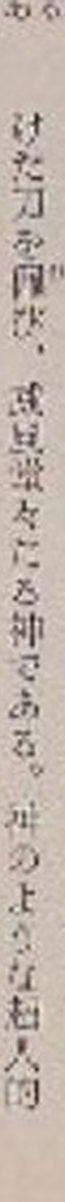けた刀を佩び、威風堂々たる神である。のような超人的
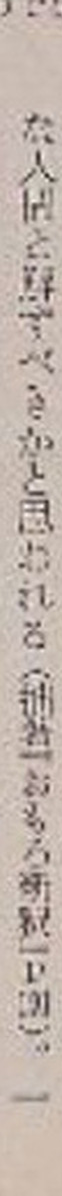な人間と解すべきかと思われる(拙著『おもろ新釈』Ｐ)。一
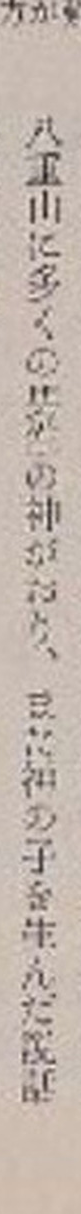八重山に多くの男性の神がおり、また神の子を生んだ話
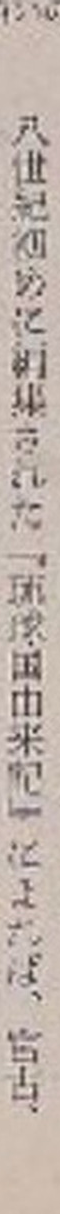八世紀初めに編集された『琉球国由来記』によれば、宮古、
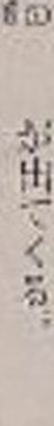が出てくる。
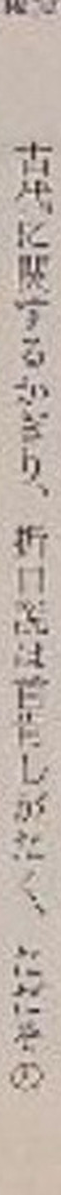古代に関するかぎり、折口説は首肯しがたく、ただその
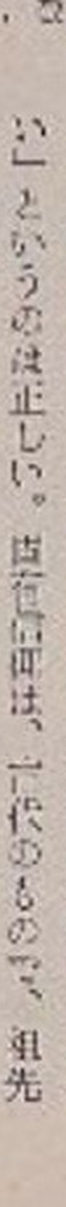い」というのは正しい。固有信仰は、古代のもので、祖先
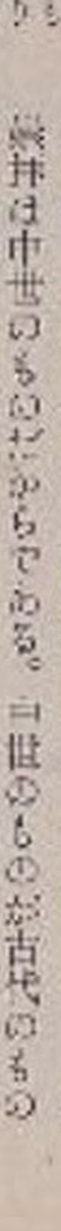崇拝は中世のものだからである。中世のものが古代のもの
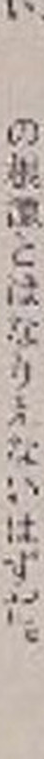の根源とはなりえないはずだ。
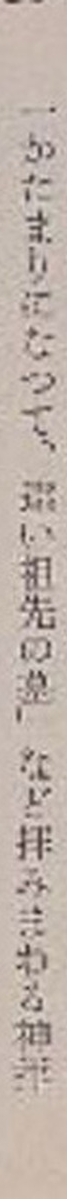一かたまりになつて、遠い祖先の墓」など拝みまわる神拝
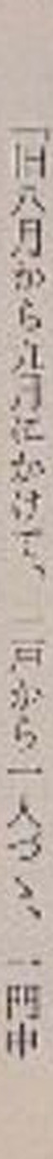「旧八月から九月にかけて、一戸から一人づゝ、一門中
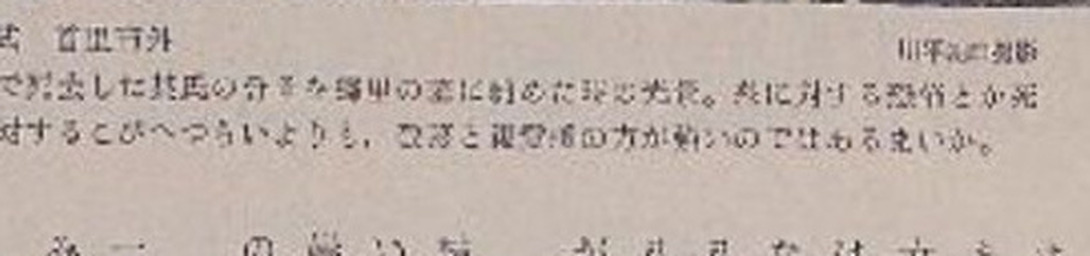霊に対するこびへつらいよりも、との方が強いのではあるまいか。
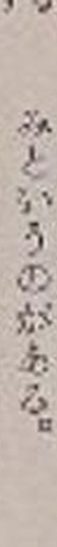みというのがある。
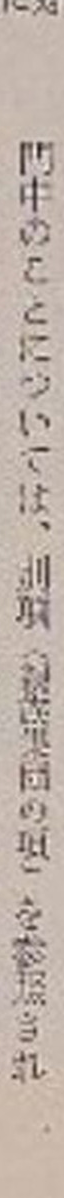門中のことについては、別項(親族集団の項)を参照され
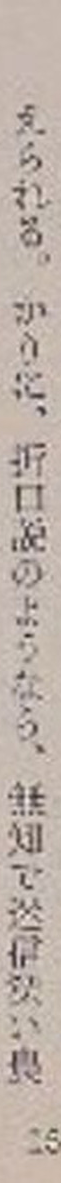えられる。かりに、折口説のようなら、無知で迷信深い農
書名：沖縄固有信仰のおとろえ
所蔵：University of the Ryukyus Library
